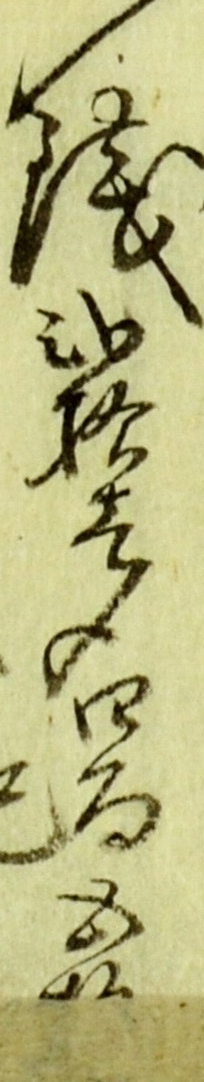銭弐拾壱貫四百五拾四文
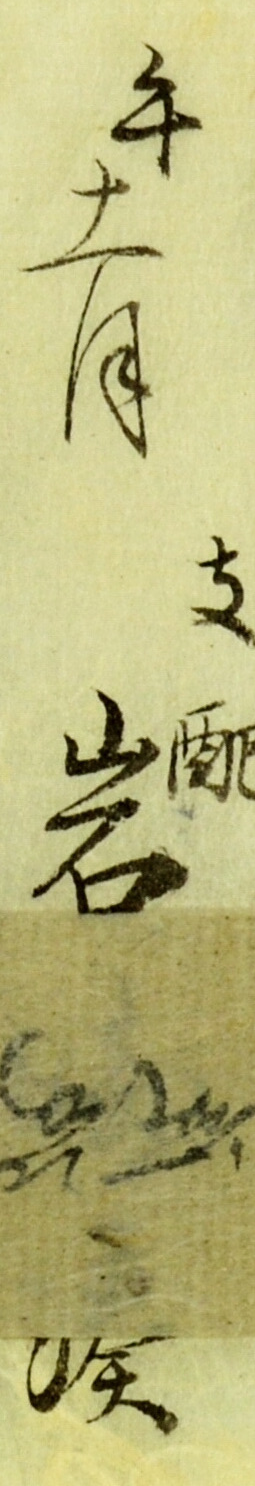午十一月岩崎湊

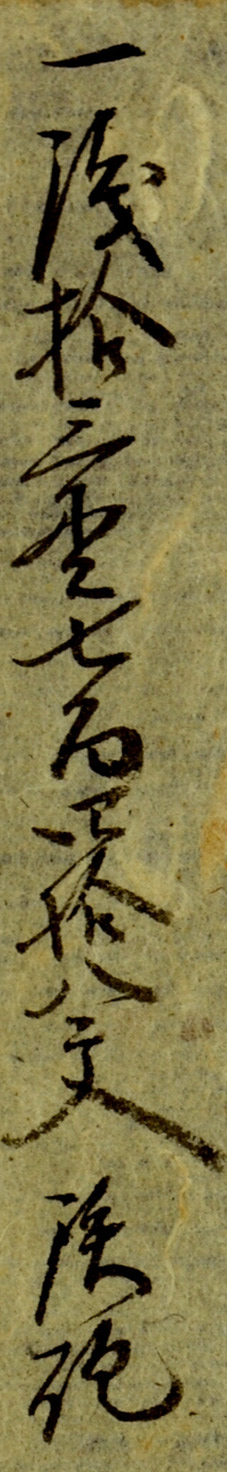一銭拾三貫七百四拾八文鉄砲

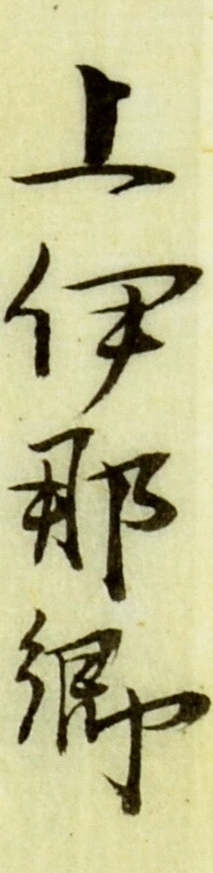上伊那郷
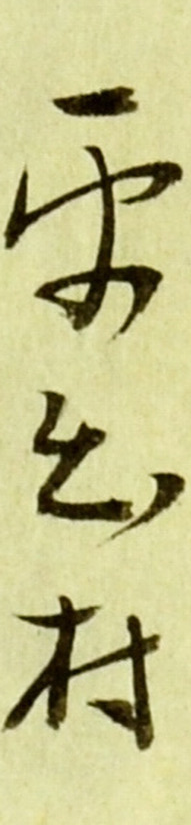平出村
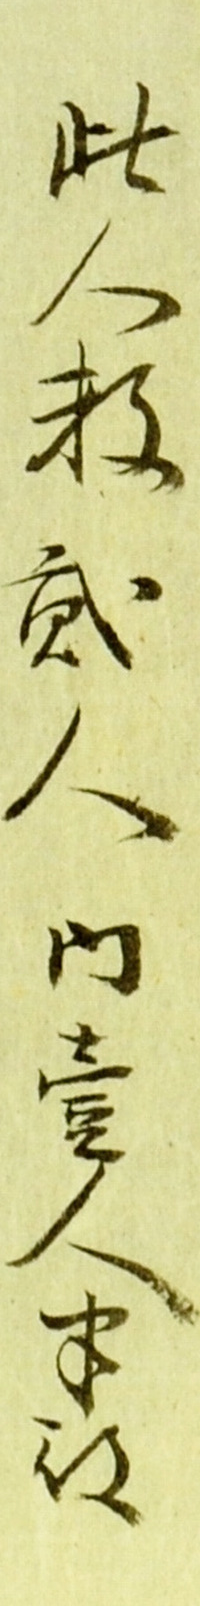此人数弐人内壱人半役
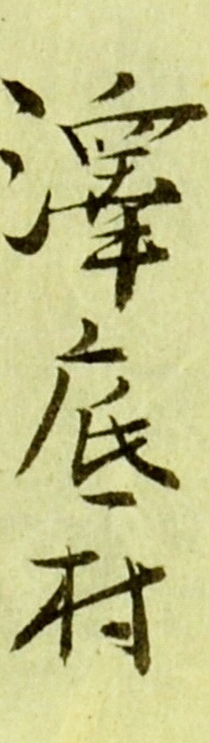沢底村
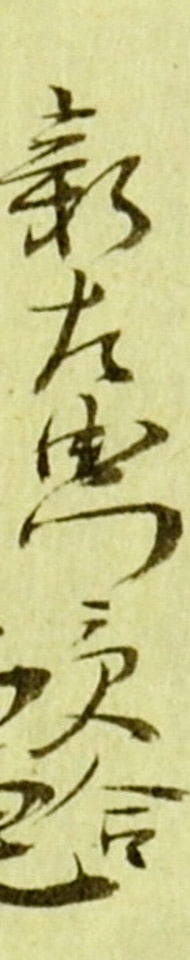新左衛門受合
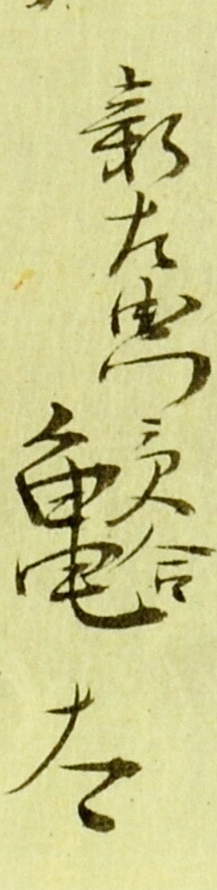新左衛門受合
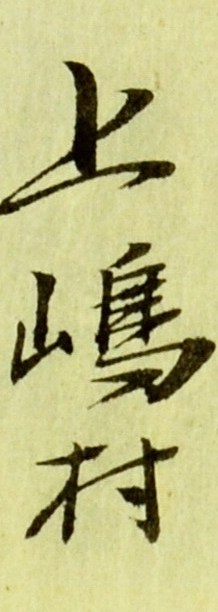上島村
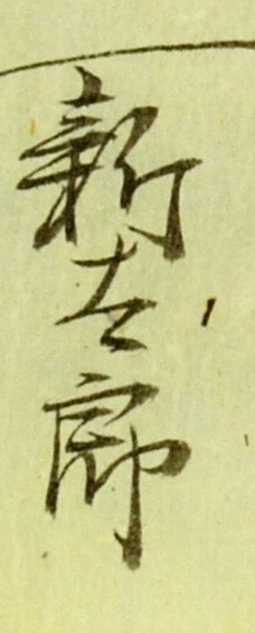新太郎

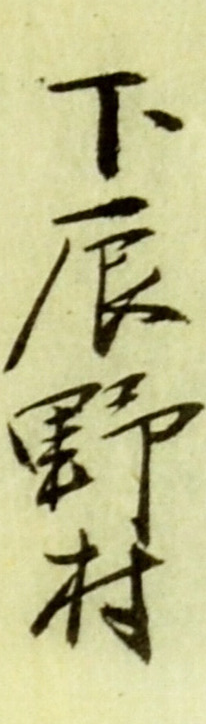下辰野村
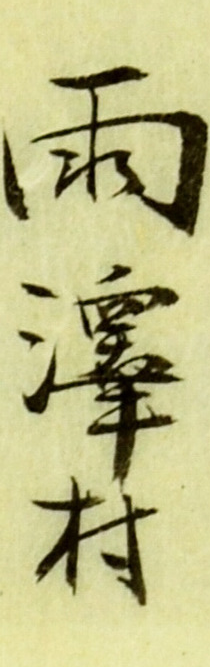雨沢村
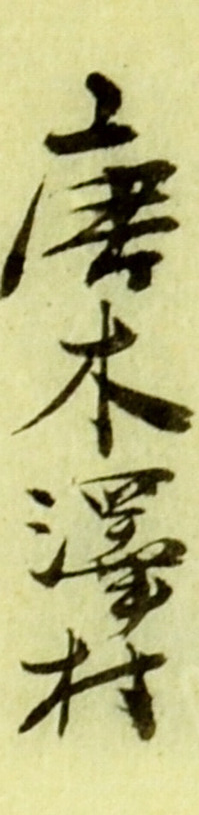唐木沢村
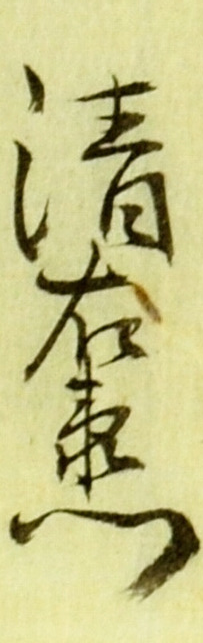治右衛門
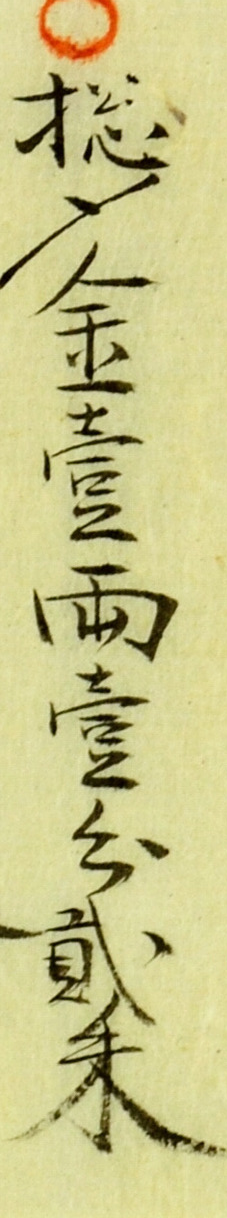〇総〆金壱両壱分弐朱
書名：上伊那郷諸運上取調帳
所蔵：伊那市立高遠町図書館・合同会社AMANE
